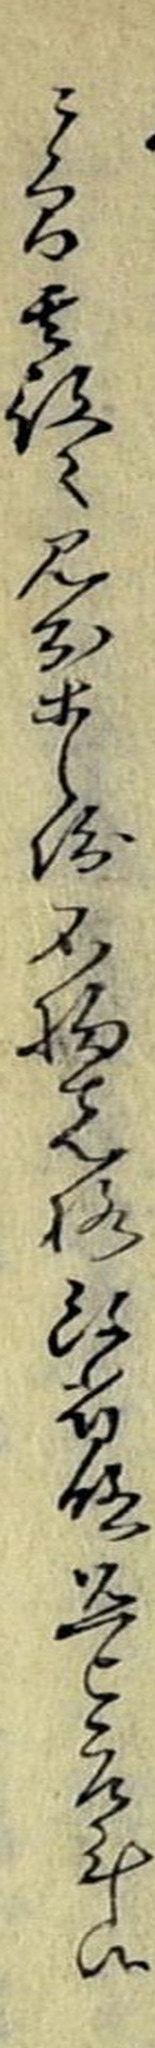に候間其役々見分等之儀不拘先格致省略宜被取斗候
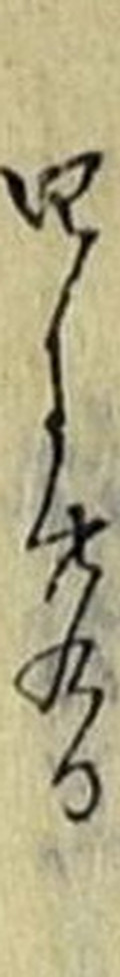四月廿九日
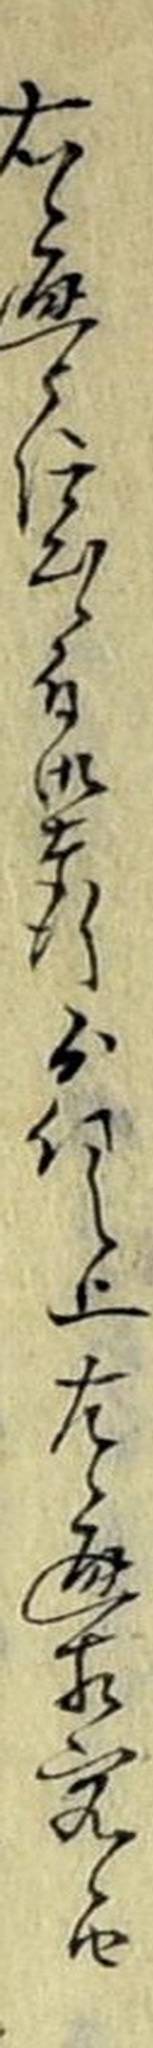右之通被仰出候に付御奉行ゟ伺之上左之通相究候由
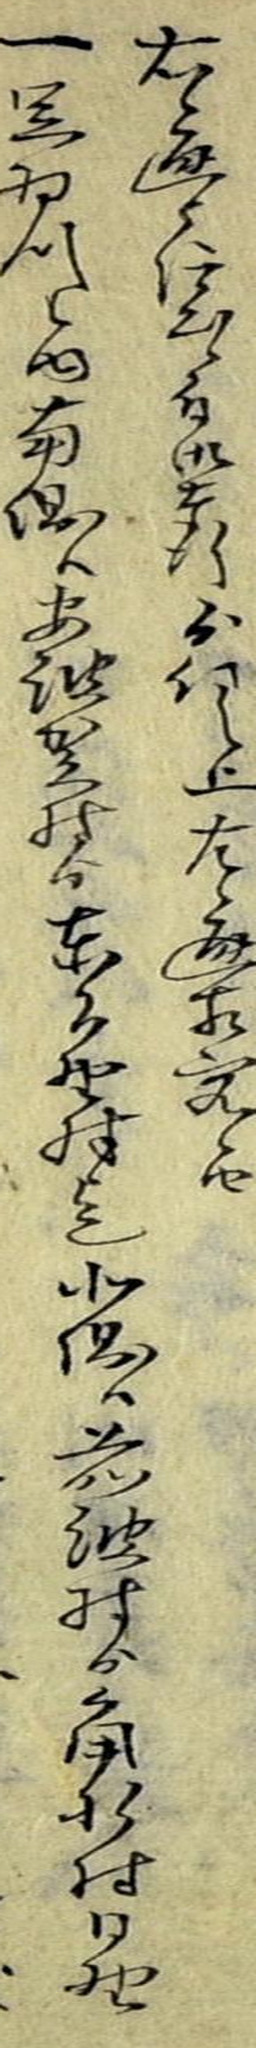一足羽川之内南側は安波賀村ゟ東下野村迄北側は前波村ゟ角折村日野
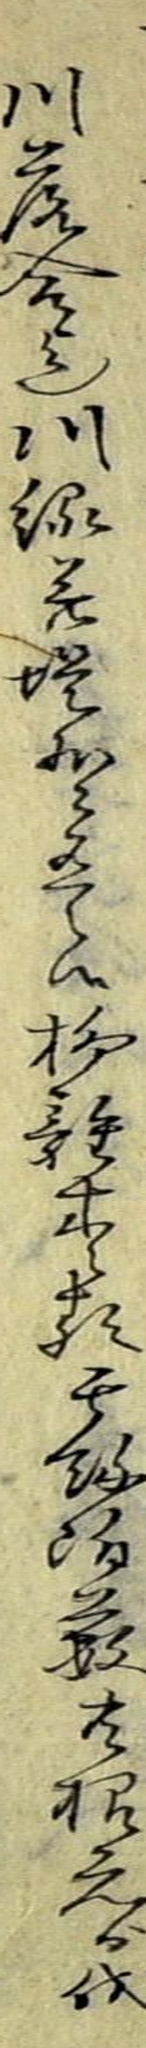川落合迄川縁并堤外に有之候柳雑木之類其餘附藪共根元ゟ伐
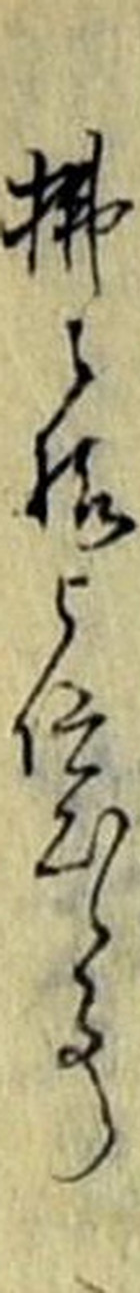払候様被仰出候事
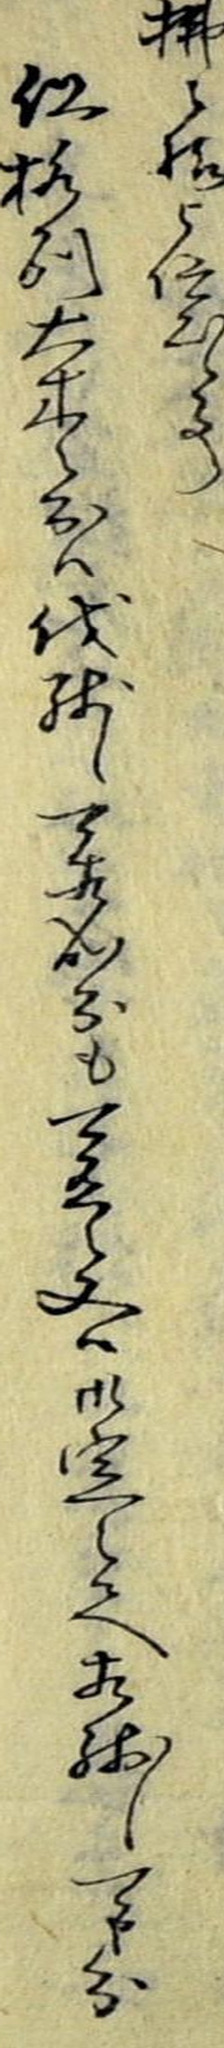但各別大木之分は伐残し可相成分も可有之又は御定之尺相残し可申分

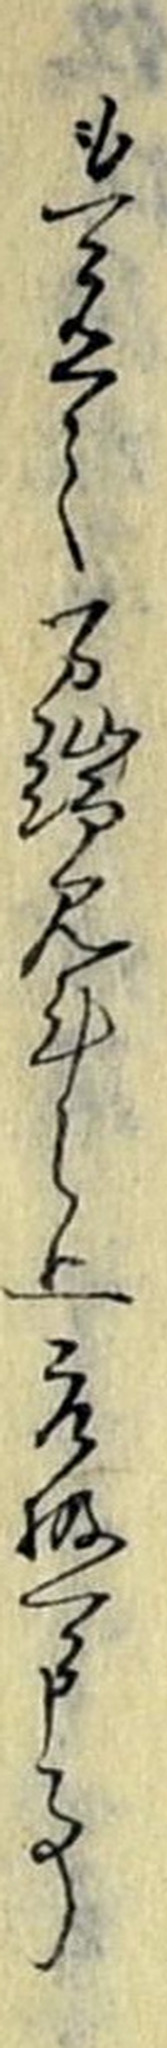も可有之万端見斗之上取扱可申事
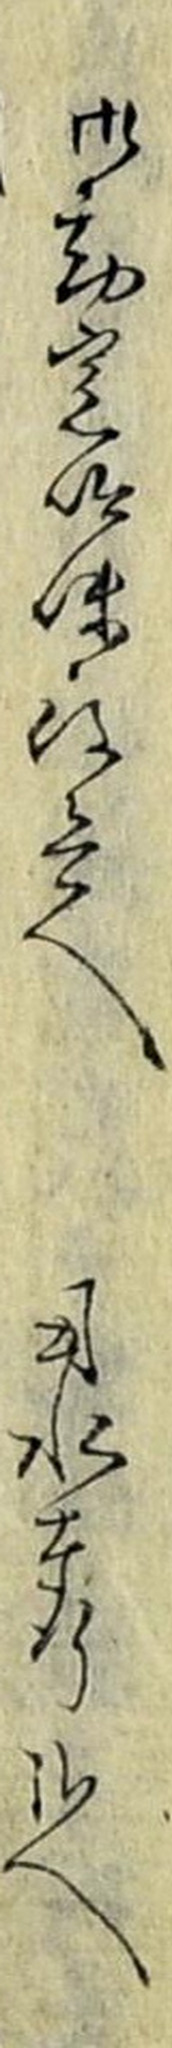御勘定吟味役壱人用水奉行弐人
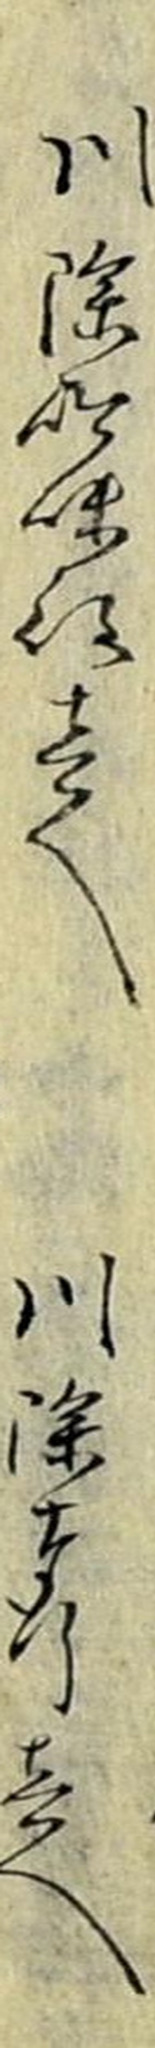川除吟味役壱人川除奉行壱人
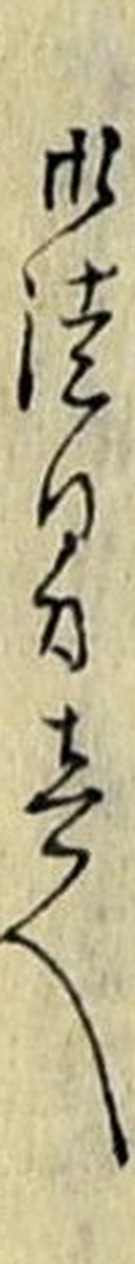御徒目付壱人
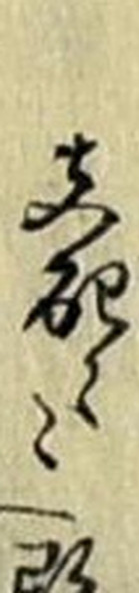支配頭
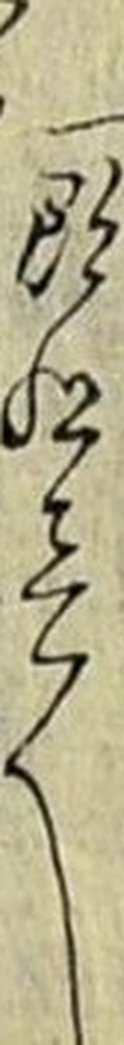郡組壱人
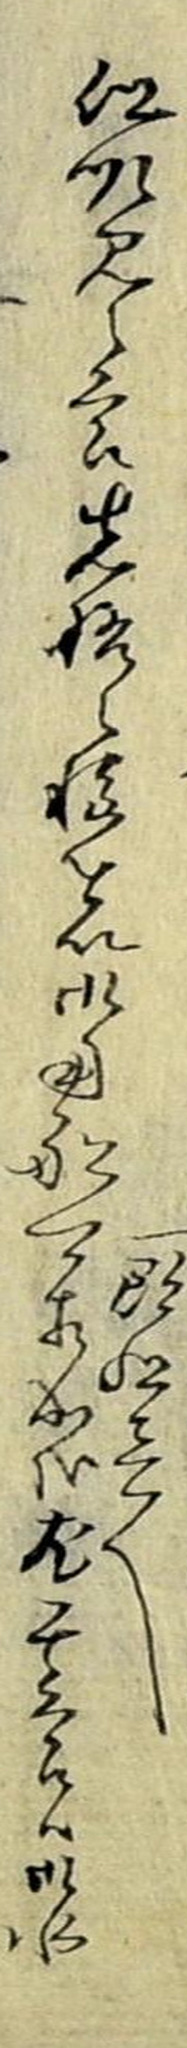但巡見之節先格之移を以御用船可相成哉尤其節は御水
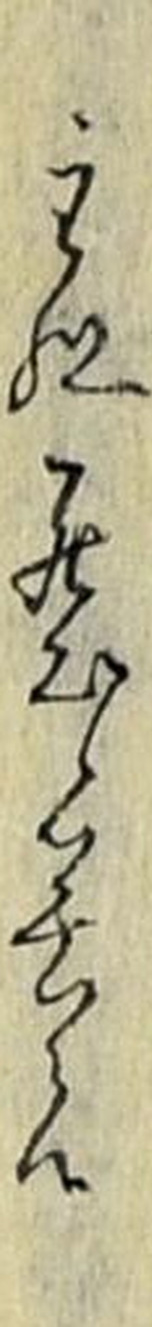主組罷出筈に候
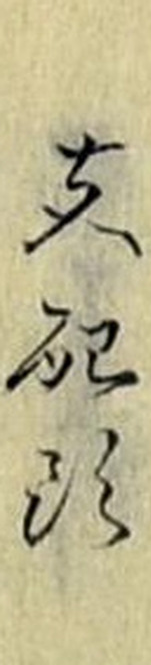支配頭
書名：命令之部 六
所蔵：福井県文書館 Fukui Prefectural Archives
